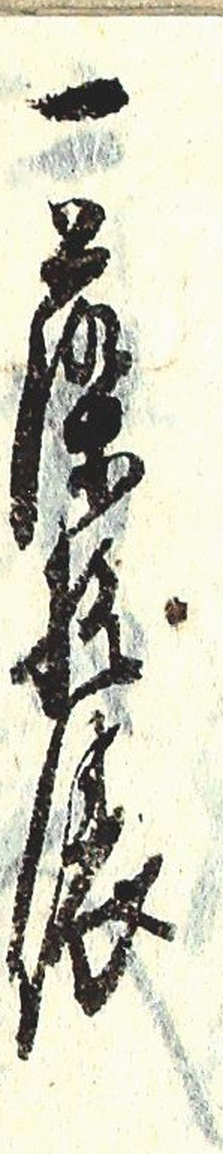一蒅拾俵
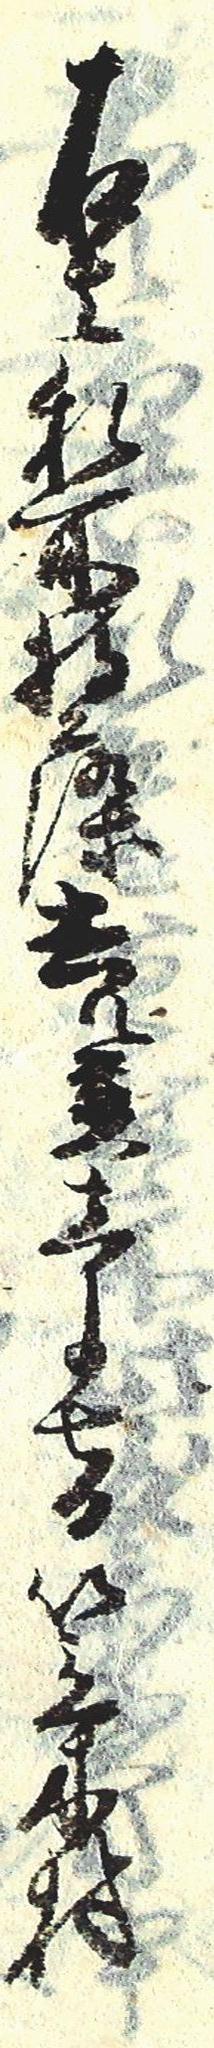右は私所持蒅去る亥十二月七日笠木村
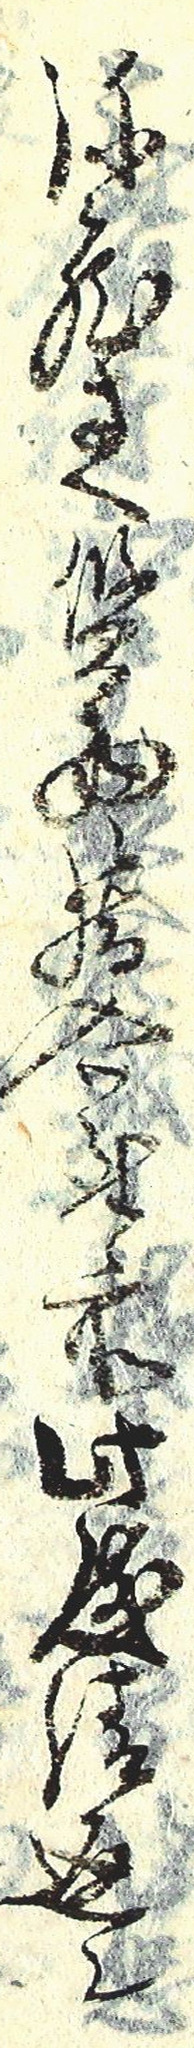弥蔵方へ質物に指入御座候所此度請返し
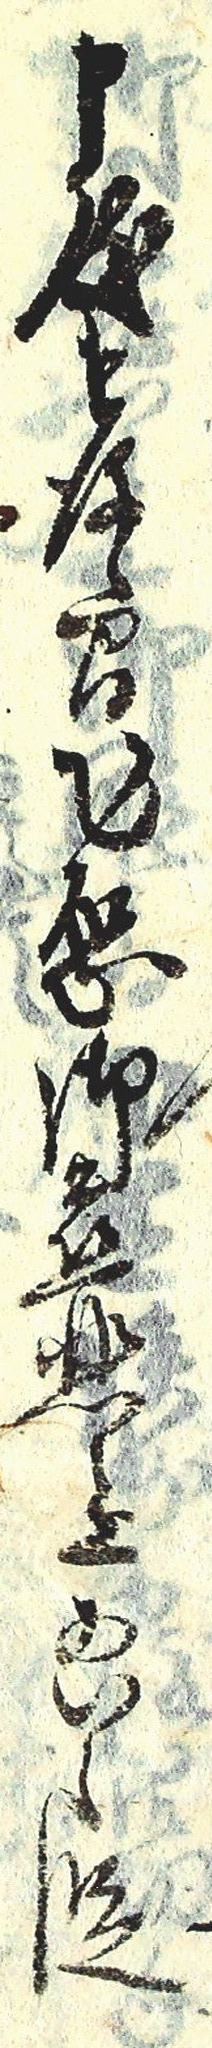申度奉存候間乍恐御慈悲之上右之段
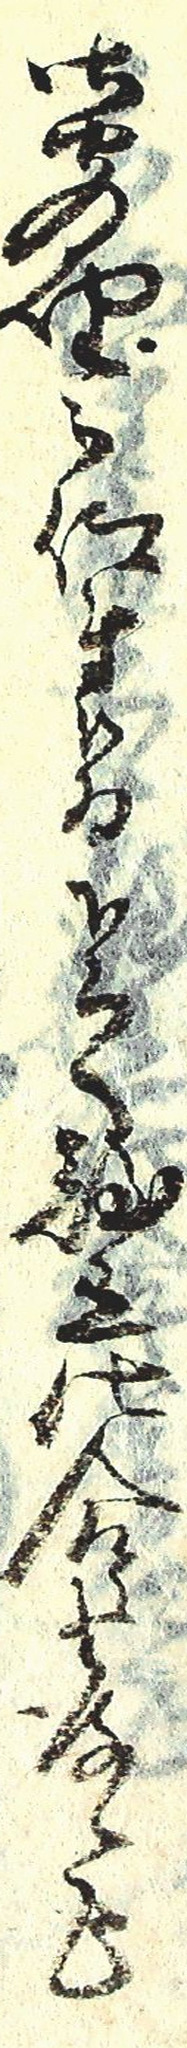御聞届被仰付被為下候はゝ難有仕合に奉存候以上
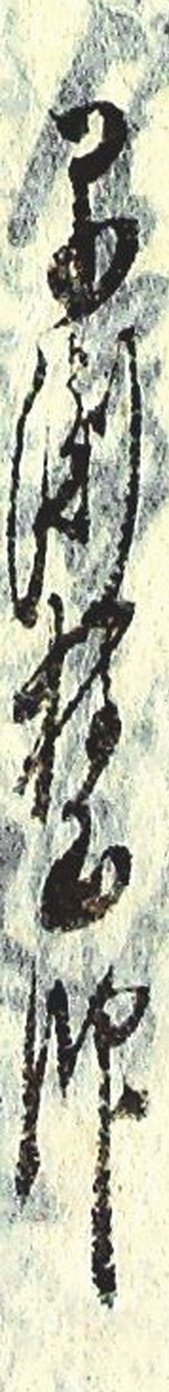早淵村玉師
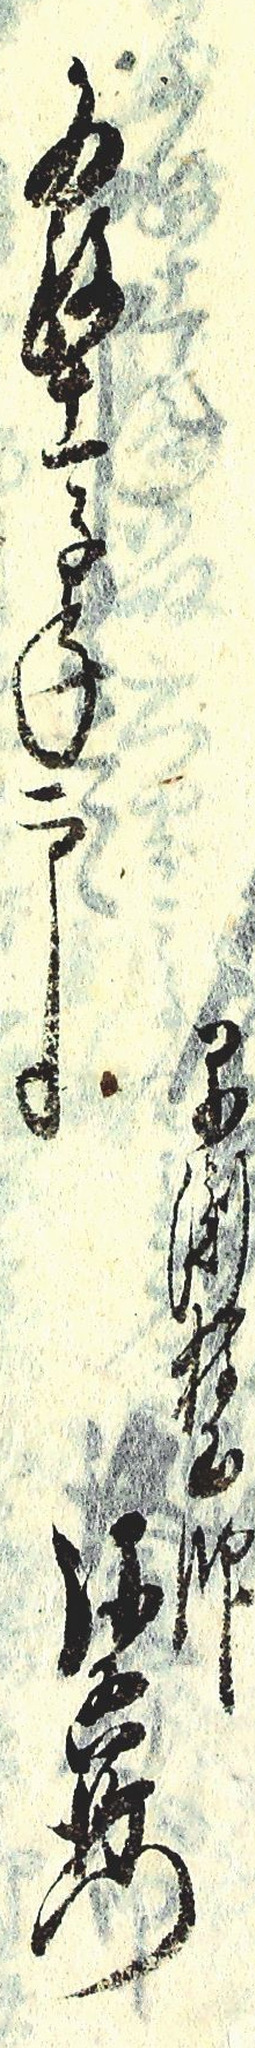文政十一子年二月弥右衛門
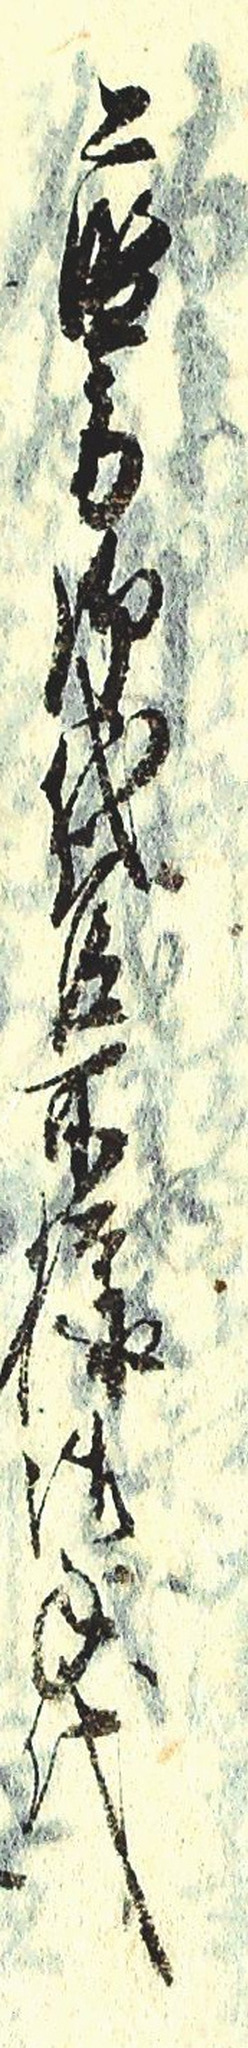藍方御代官所様御手代
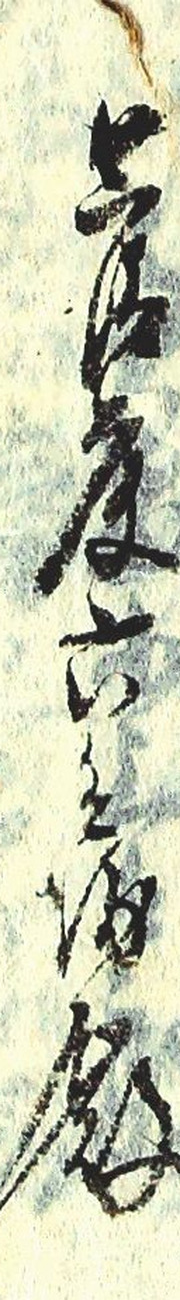菅藤六兵衛殿
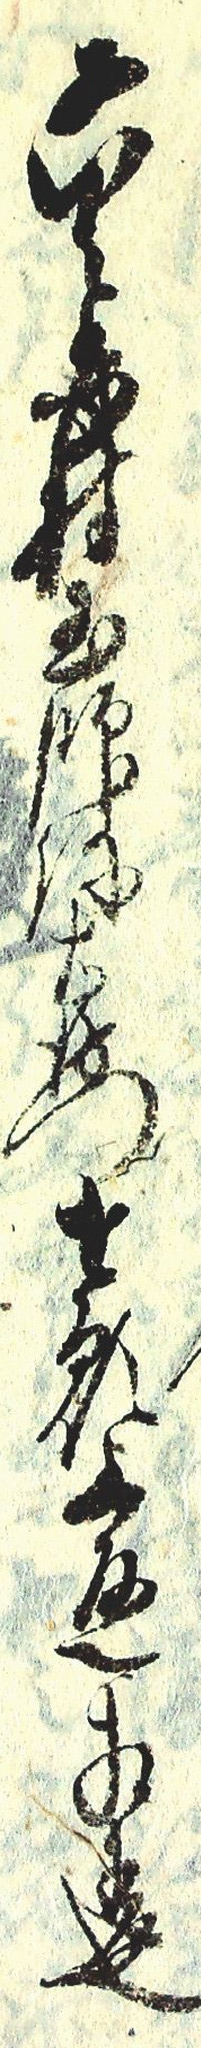右は当村玉師弥右衛門奉願上通相違
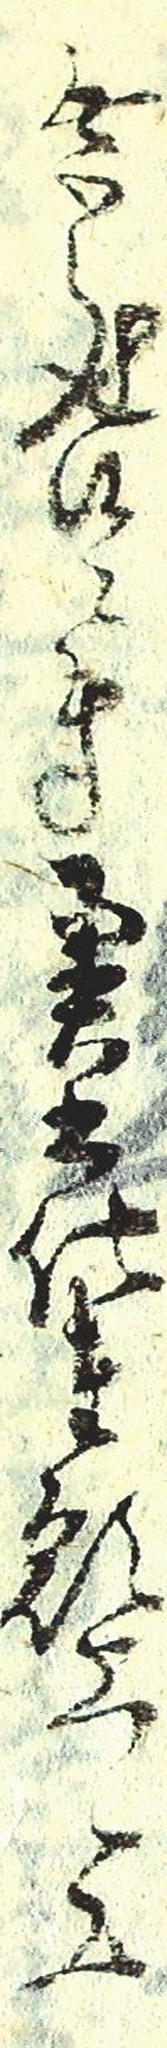無御座候に付奥書仕奉願上候以上
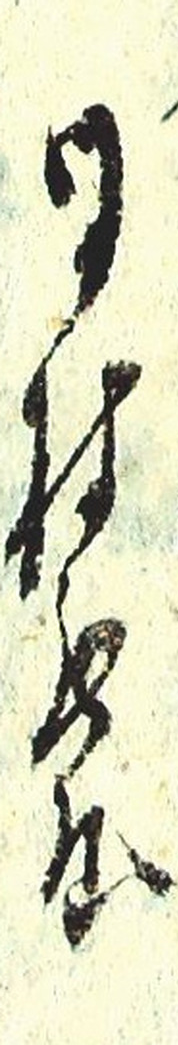同村庄屋
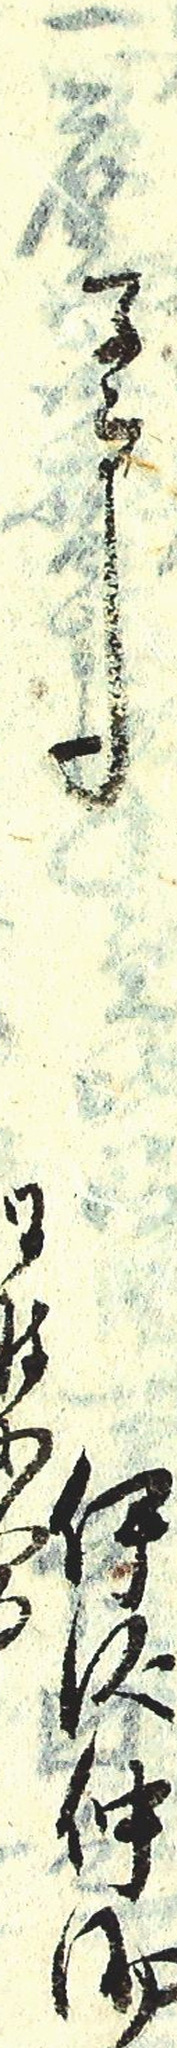子二月伊沢仲助
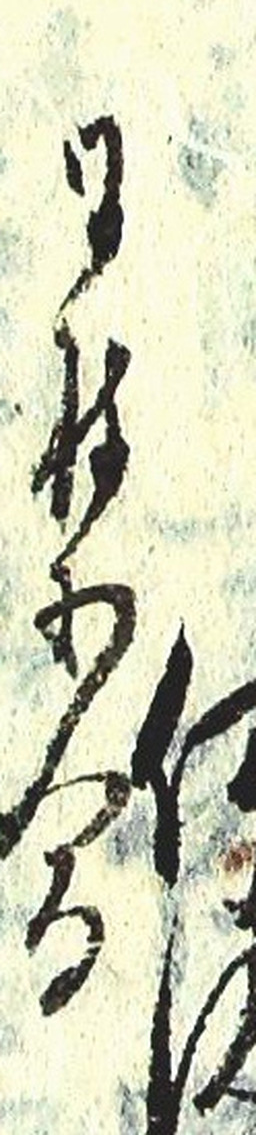同村五人与
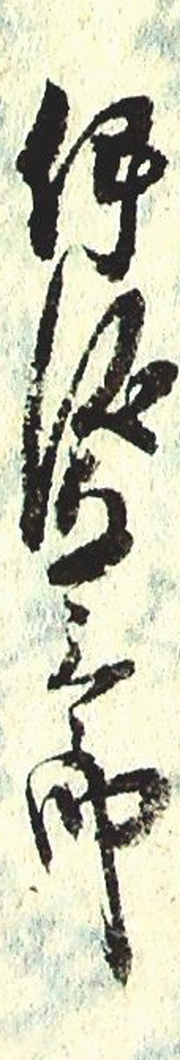伊沢与三郎
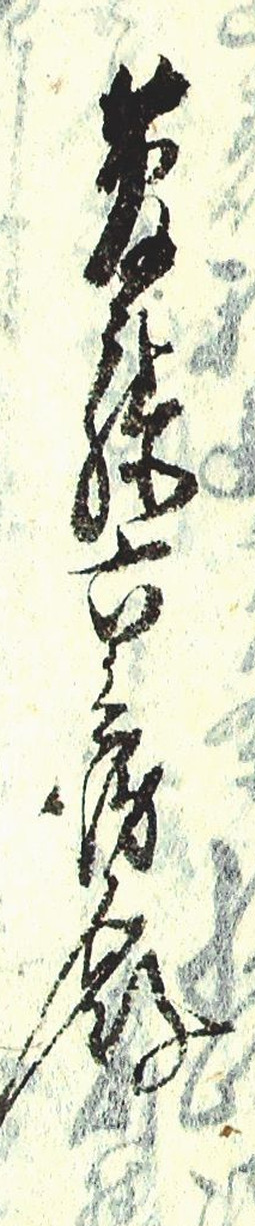菅藤六兵衛殿
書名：諸御願書控(弐番）
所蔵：鳴門教育大学 Naruto University of Education
